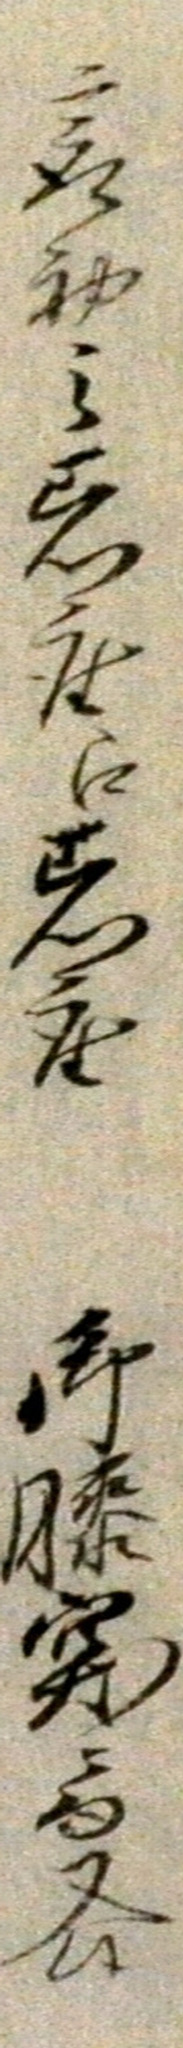最初之着座え着座御膝突ニ而又候
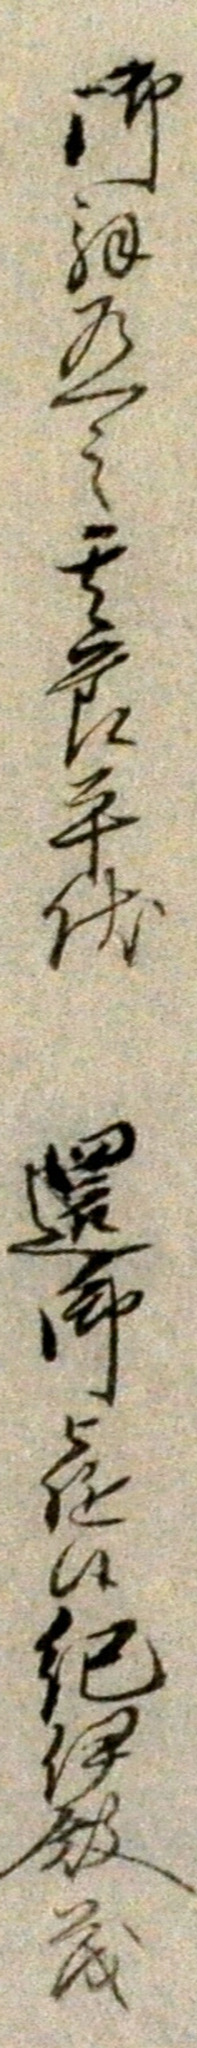御拝有之其節平伏還御被遊候紀伊殿も
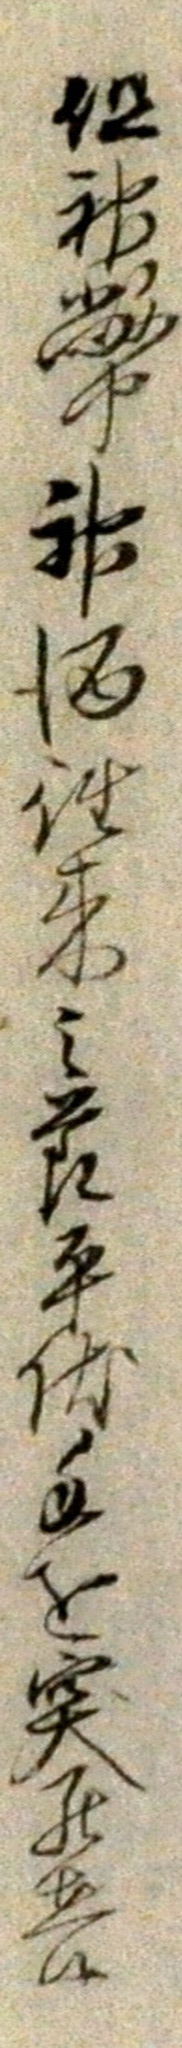但神幣神酒往来之節平伏手を突罷在候
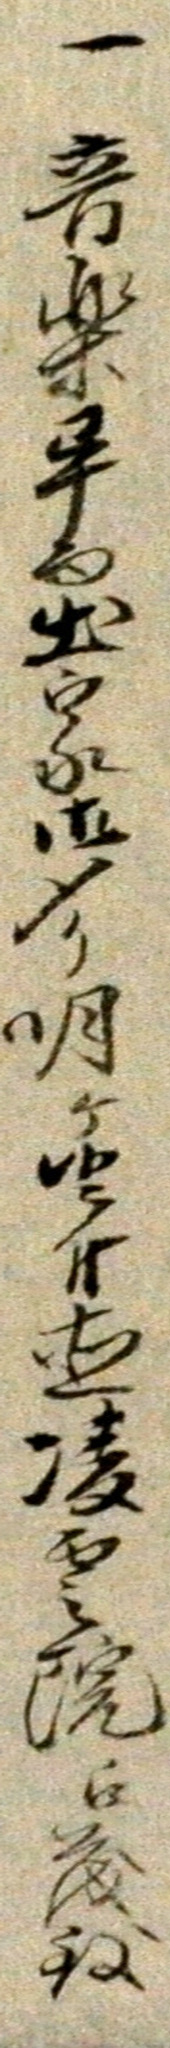一音楽畢而出家御〆り明ケ候ニ付直凌雲院えも致
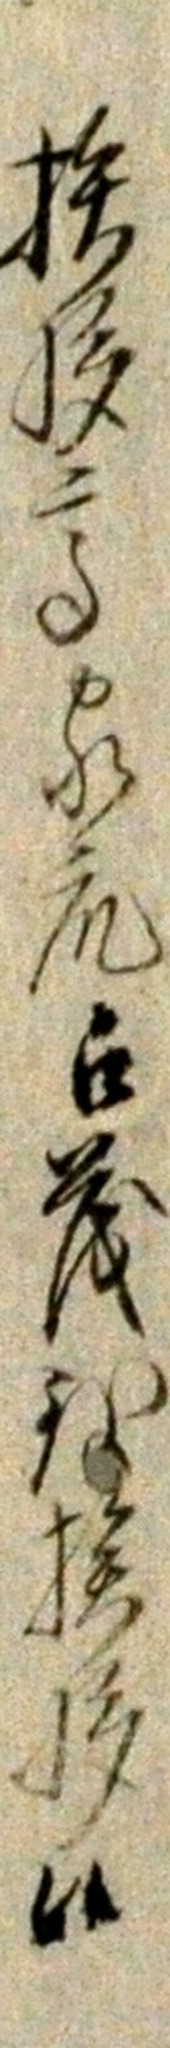挨拶高家衆えも致挨拶候
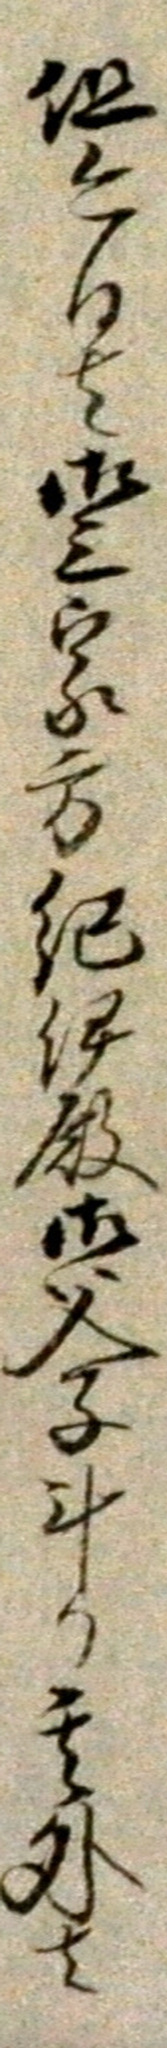但今日は御三家方紀伊殿御父子計り其外は
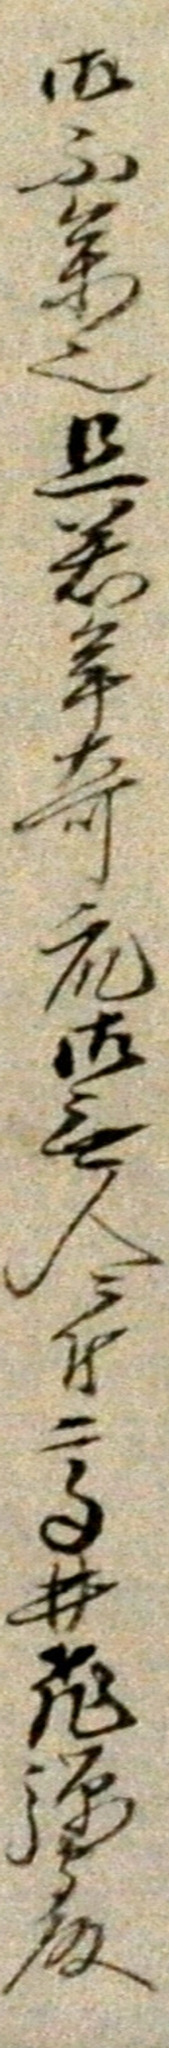御不参也且若年寄衆御無人ニ付高井飛騨守殿
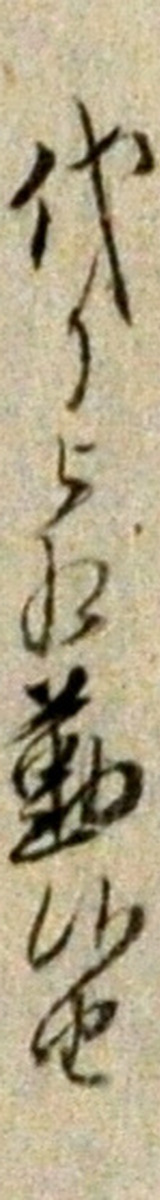代り被相勤候由
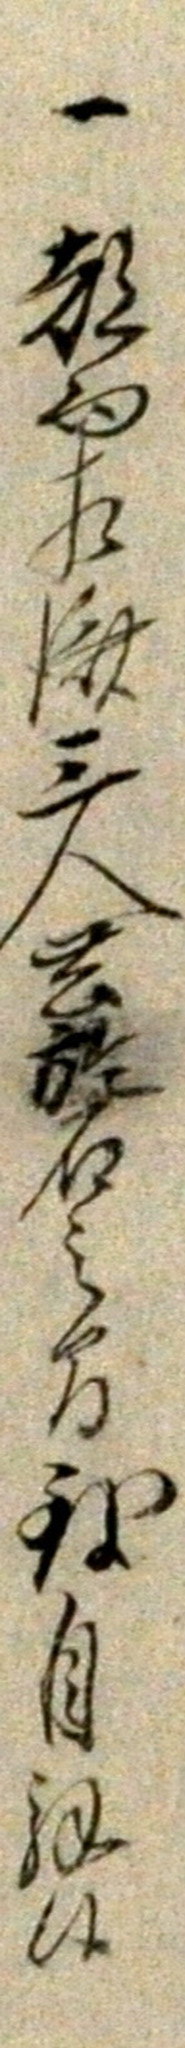一都而相済三人共於石之間致自拝候
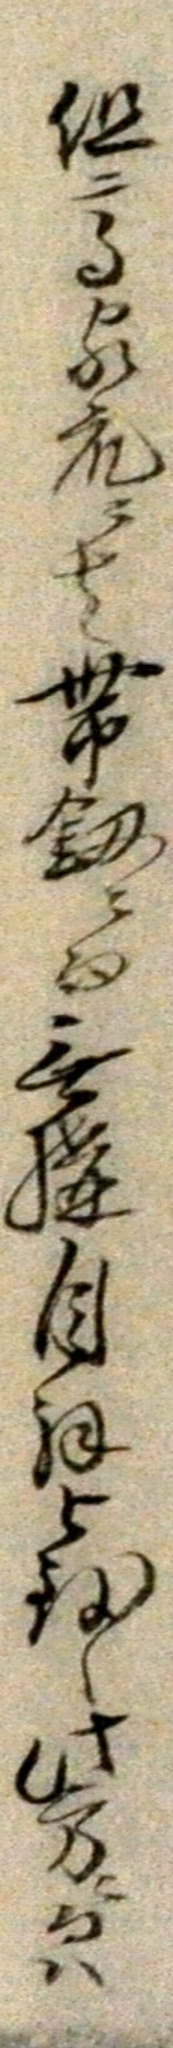但高家衆には帯剱ニ而無構自拝被致候此方ニ而ハ
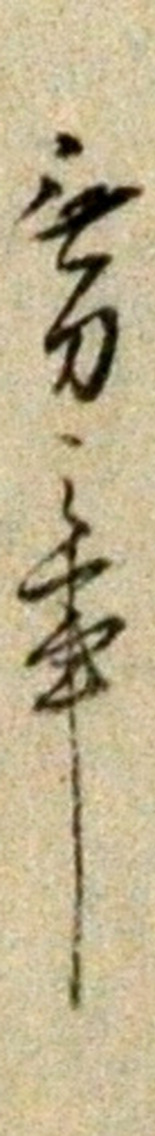無刀之事
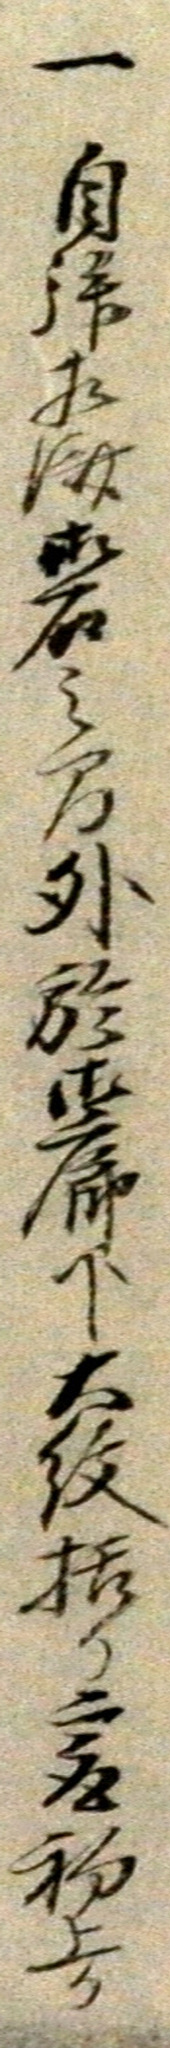一自拝相済御石之間外於御廊下大紋括り最初上り
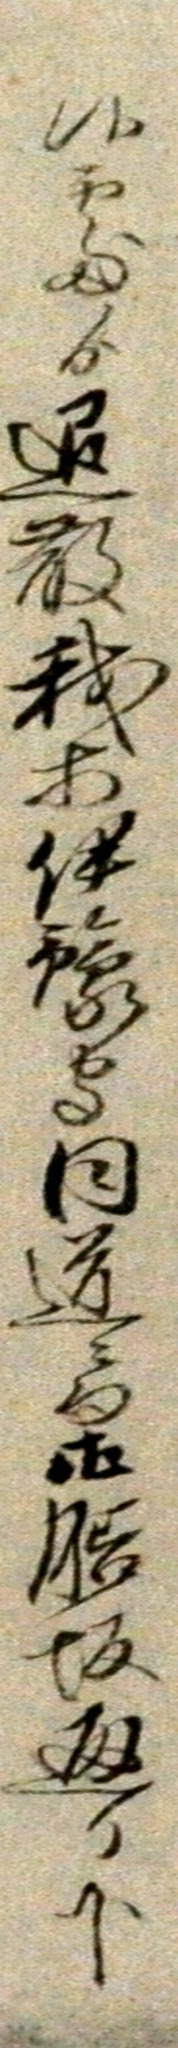候処ゟ退散我等伊豫守同道ニ而御膳坂通り下
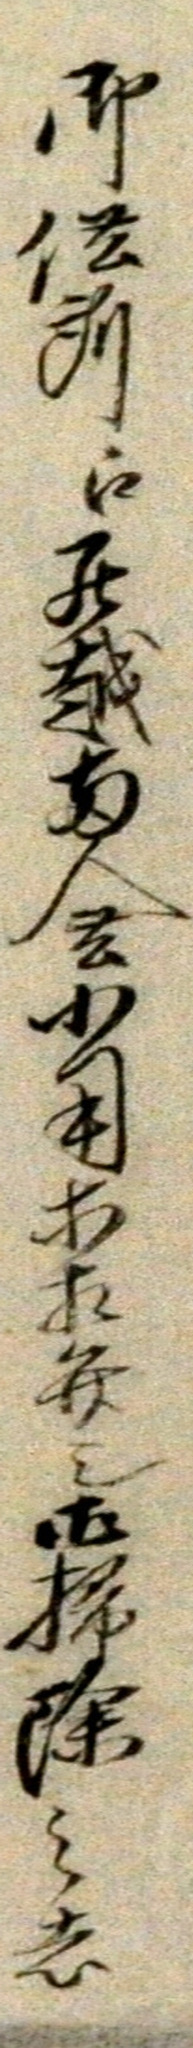御供所え罷越両人共小用等相弁シ御掃除之者
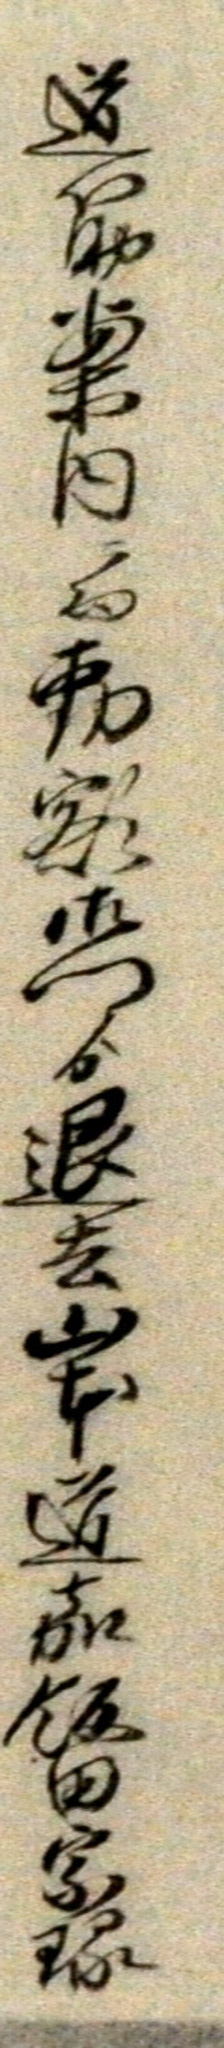道筋案内ニ而勅願御門ゟ退去山本道嘉飯田宗録
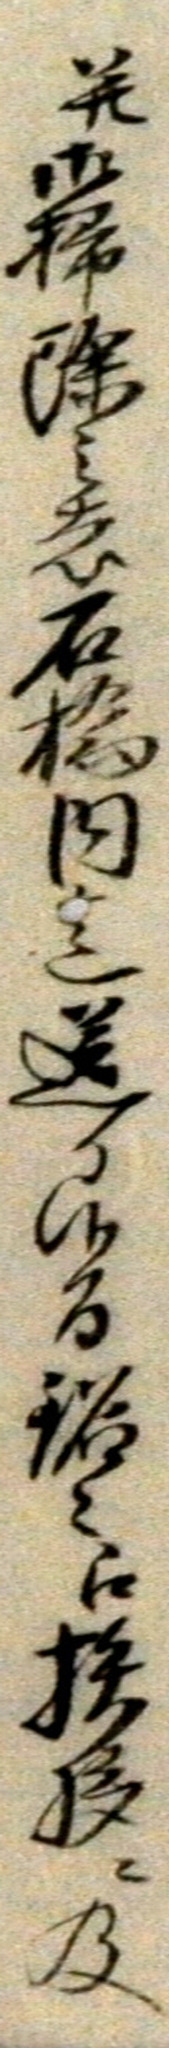并御掃除之者石橋内迄送り候間銘々え挨拶ニ及
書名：御鏡餅御用留（写）
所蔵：伊那市立高遠町図書館・合同会社AMANE
